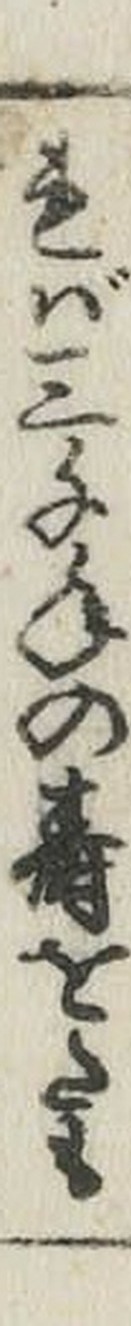れば三千年の寿をたも
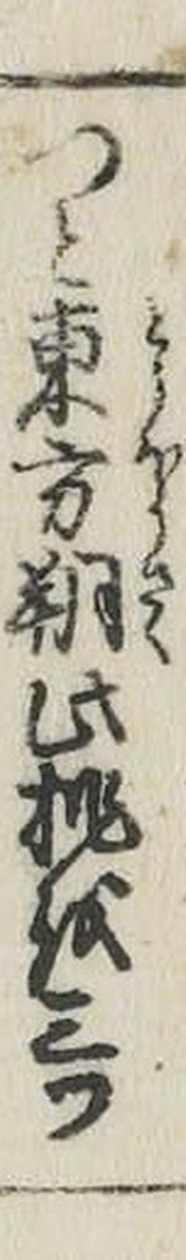つと東方朔此桃を三つ
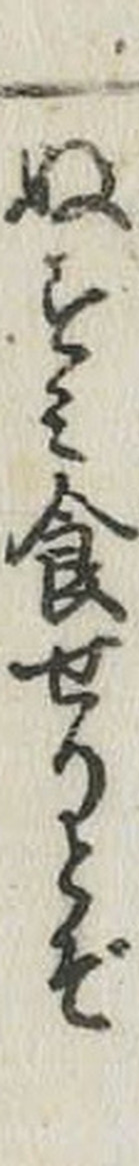ぬすみ食せりとぞ
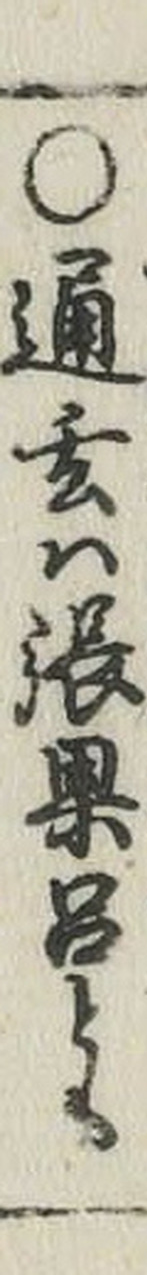○通玄は張果呂とも
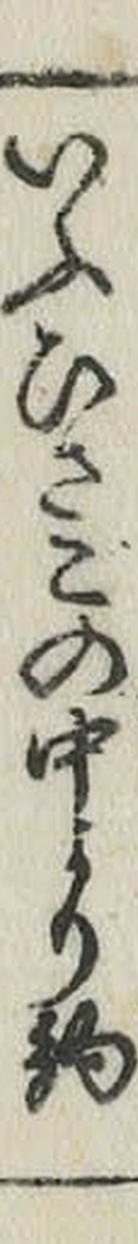いふひさごの中より駒
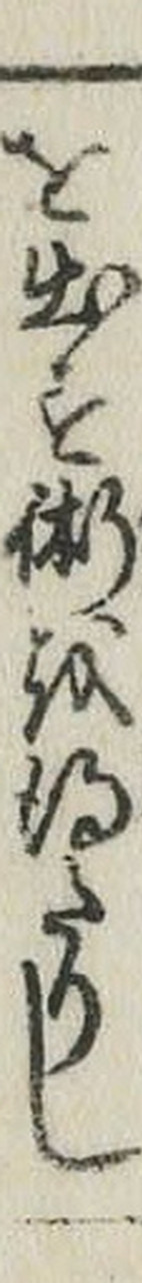を出す術を得たりし
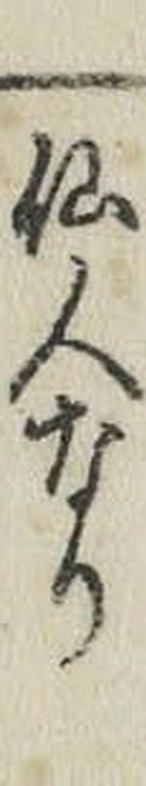仙人なり

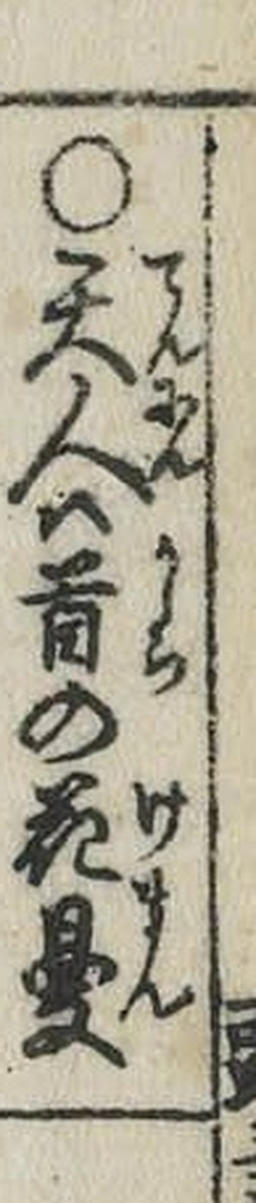○天人は首の花曼
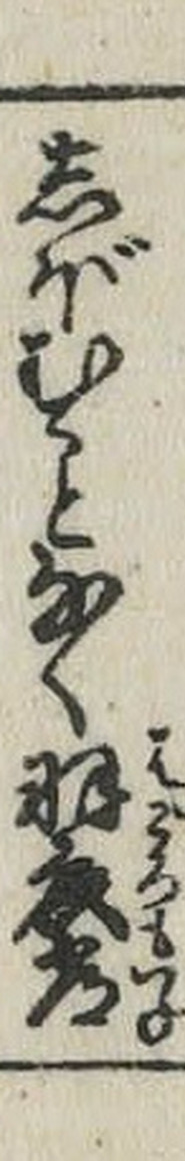しぼむことなく羽衣常
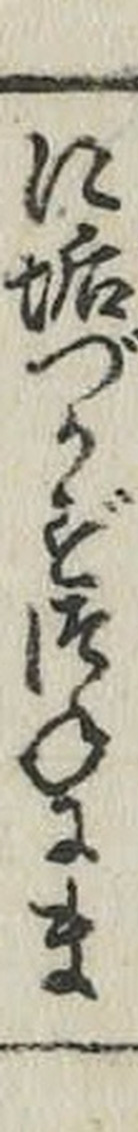に垢づかずつねにま
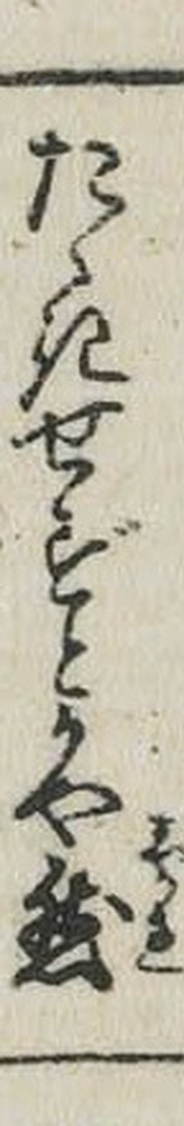たゝきせずとかや然
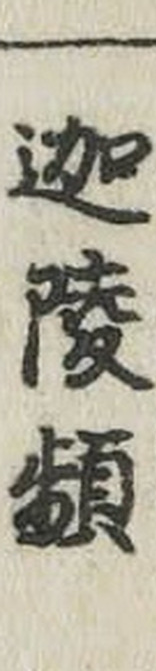迦陵頻
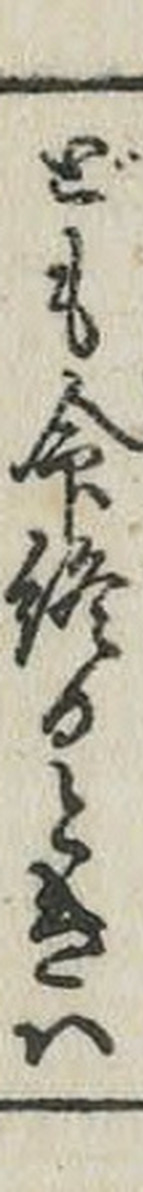ども命終るときは
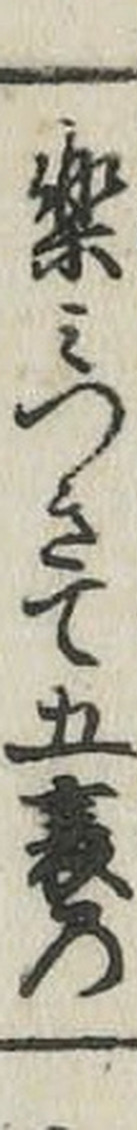楽みつきて五衰の
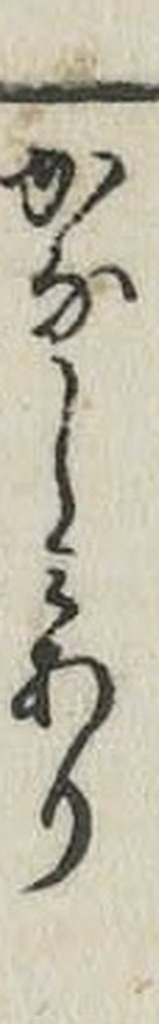かなしみあり
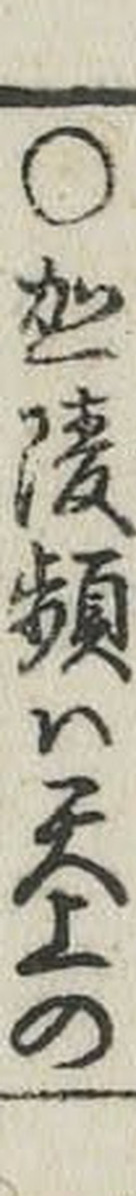○迦陵頻は天上の
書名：増補頭書訓蒙図彙大成 10巻 10:巻之21
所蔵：東京学芸大学教育コンテンツアーカイブ
